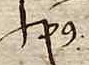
tp̄ꝯ
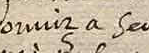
ouuir a seu
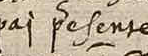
paj p̄esente
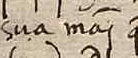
sua māj q̄
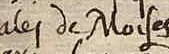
a lej de Moises
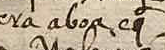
era a boa e q̄
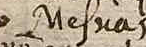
o Messias
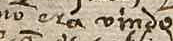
nō era vindo
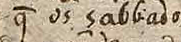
e q̄ os sabbados
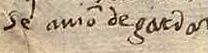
se auiō de gardar
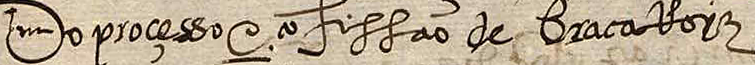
Do proçesso e cōfissaõ de Braca Royz̄
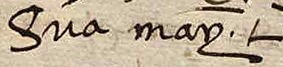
Sua maȳ.
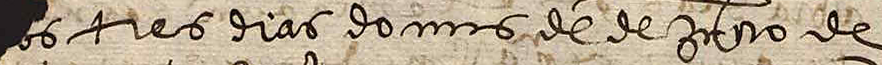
_os tres dias do mes de dezēbro de
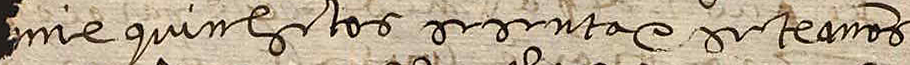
mil quinhētos sessenta e sete anōs
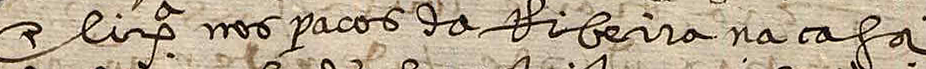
ē lixa. nos pacos da Ribeira na casa
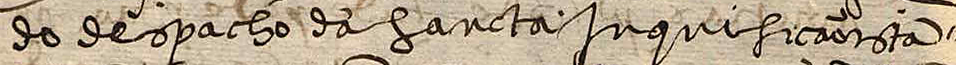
do despacho da sancta Jnquisição estā
